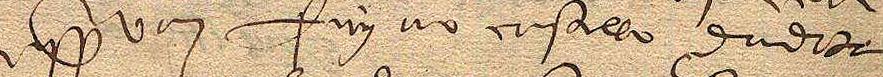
esp̄vam fuy ao castello da dita
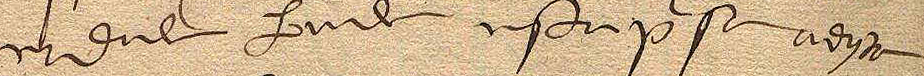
cydade honde esta p̄sa a dyta
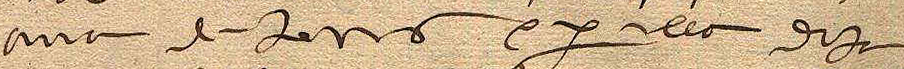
ana de tores e ꝑ ella dita
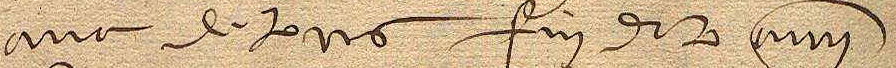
ana de tores foy dito a m̄j
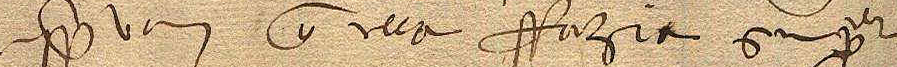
esp̄vam q̄ ella ffazia seu ꝓdor
